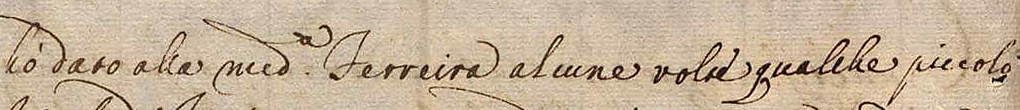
lo dato alla med.a Ferreira alcune volté qualche piccolo
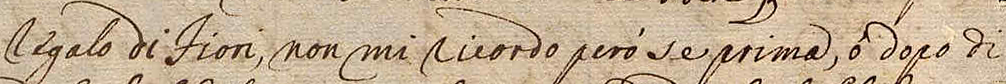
Regalo di Fiori, non mi ricordo peró se prima, ó dopo di
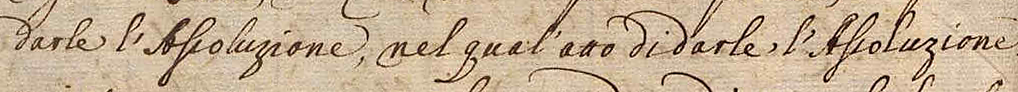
darle l'Assoluzione, nel qual'atto didarle l'Assoluzione,
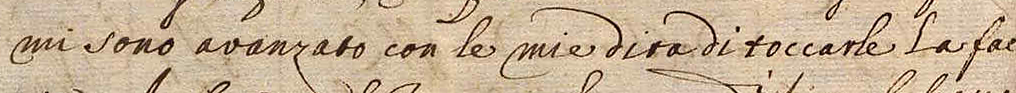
mi sono avanzato con le mie dita di toccarle La fac
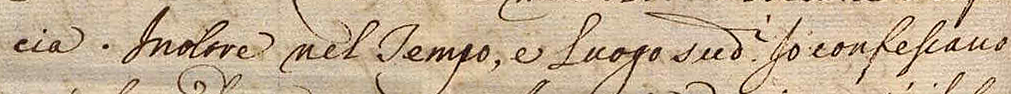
cia. Inoltre nel Tempo, e Luogo sudr Jo confessauo
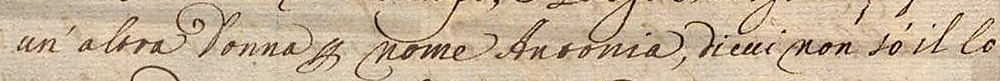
un'altra Donna ꝑ nome Antonia, dicui non so'il Co
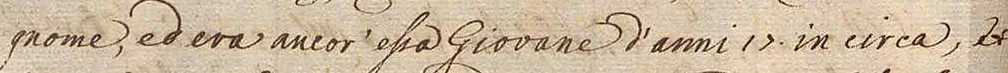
gnome, ed era ancor'essa Giovane d'anni 17. in circa, et
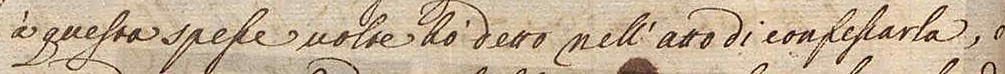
á questa spesse uolte hó detto nell'atto di confessarla, ó
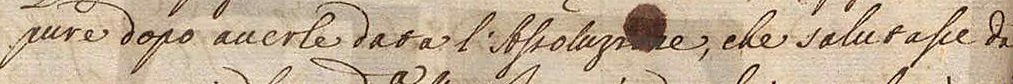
pure dopo auerle data l'Assoluzi__e, che salutasse da
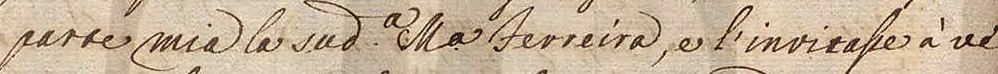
parte mia la sud.a Ma. Ferreira, e l'invitasse à vé
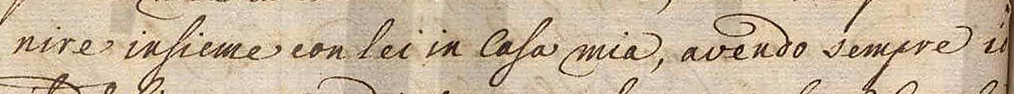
nire insieme con lei in Casa mia, avendo sempre io
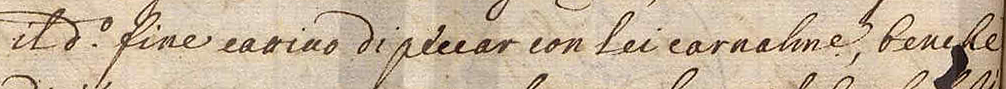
il d.o fine cattiuo di peccar con lei carnalme., benche
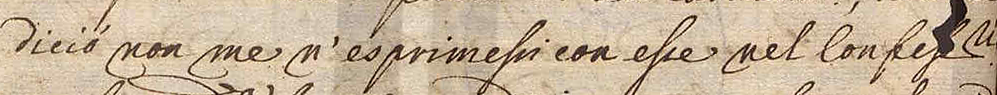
dició non me n'esprimessi con esse nel Confesri._
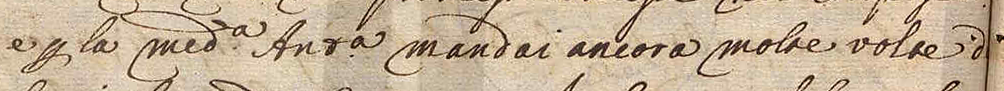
e ꝑ la meda. Anta. mandai ancora molte volte d_
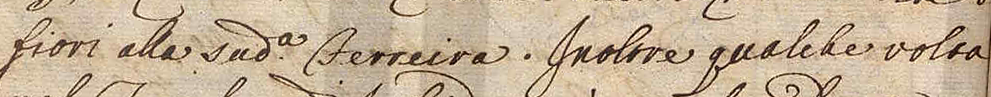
fiori alla sud.a Ferreira. Jn oltre qualche volta
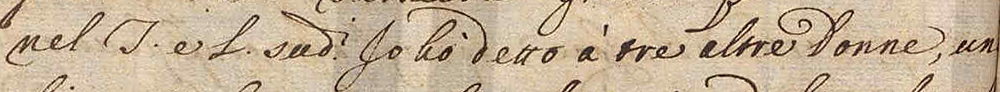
nel I. e L. sud.i Jo hó detto à tre altre Donne, un
